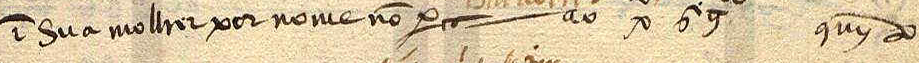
item Sua molher por nome nō ꝑca – ao po segdo qūyto
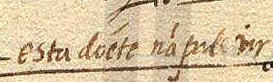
esta doēte nō pode vir
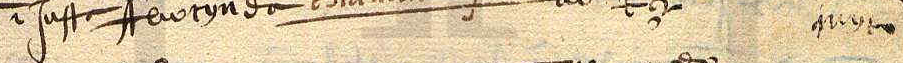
item Justa fflorynda – ao t̄cro qūyto
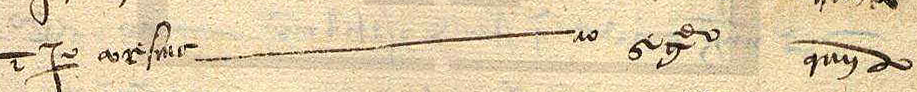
item Jo coresma – ao segdo qūyto
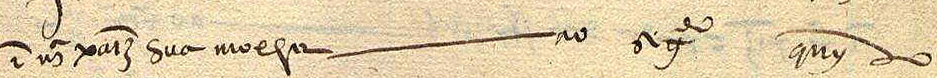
item ma paiz Sua molher – ao segdo q̄uyto
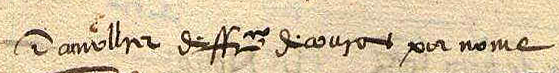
item a molher de ffrco de couros por nome
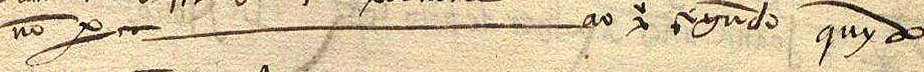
n̄o ꝑca – ao po segūdo q̄uyto
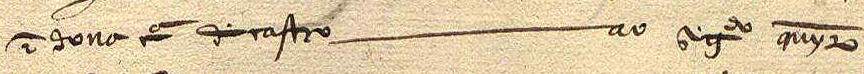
item dona ca de castro – ao segdo q̄uyto
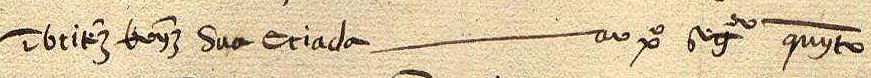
item britiz Roȳz Sua Criada – ao po segdo q̄uyto
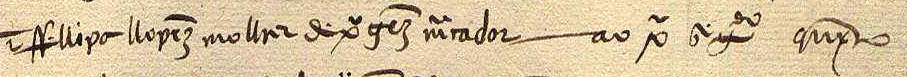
item ffellipa llopez molher de po gl̄z m̄cador – ao po segdo qūyto
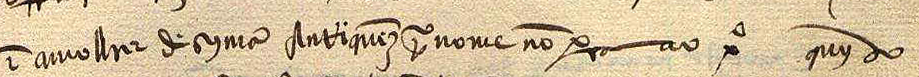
item a molher de symā Anriquez p̄o nome n̄o ꝑca – ao po q̄uyto
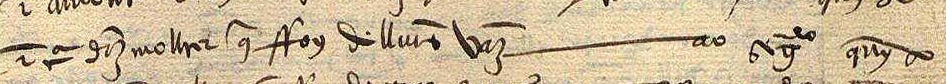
item ca dīz molher q̄ ffoy de lluis vaz̄ – ao segdo qūyto
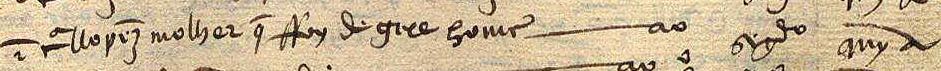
item ca llopez molher q̄ ffoy de gill homē – ao segdo qūyto
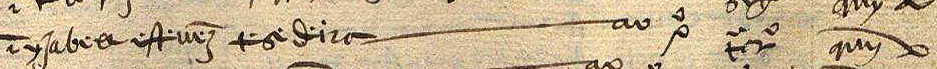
item yJabell esteuez tesedeira – ao po t̄cro q̄uyto
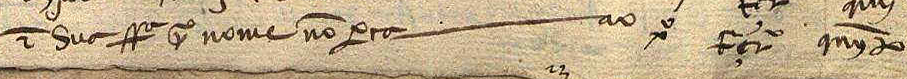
item Sua ffa p̄o nome n̄o ꝑca – ao po t̄crco qūyto
